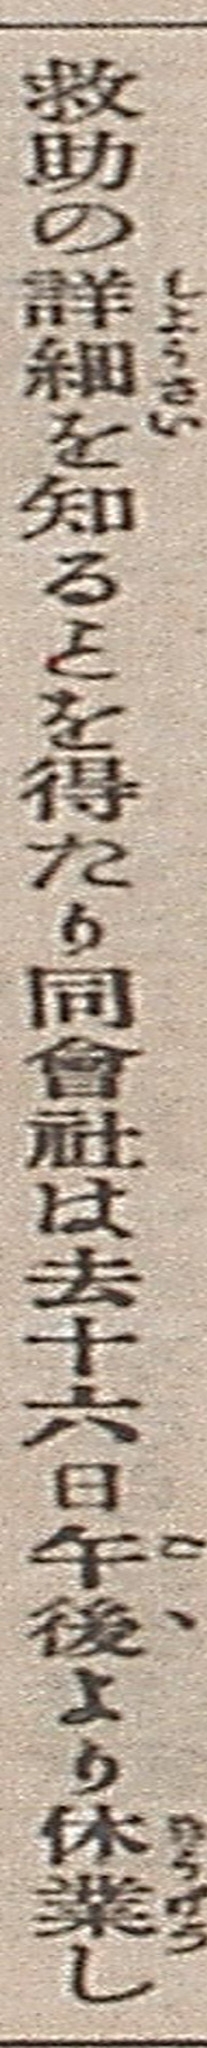救助の詳細を知ることを得たり同会社は去十六日午後より休業し
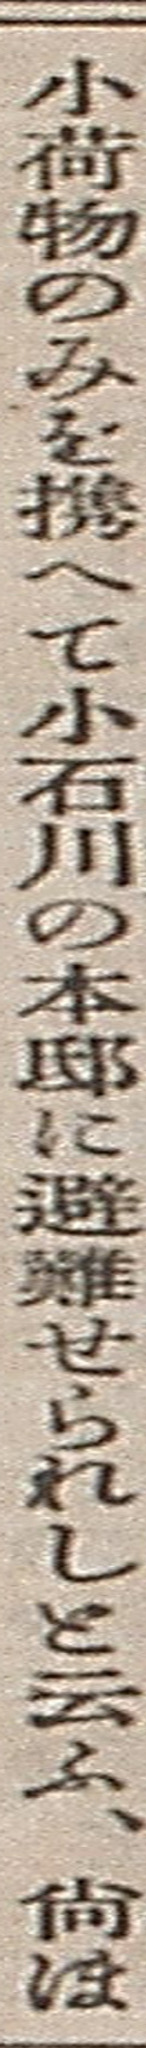小荷物のみを携へて小石川の本邸に避難せられしと云ふ、尚ほ
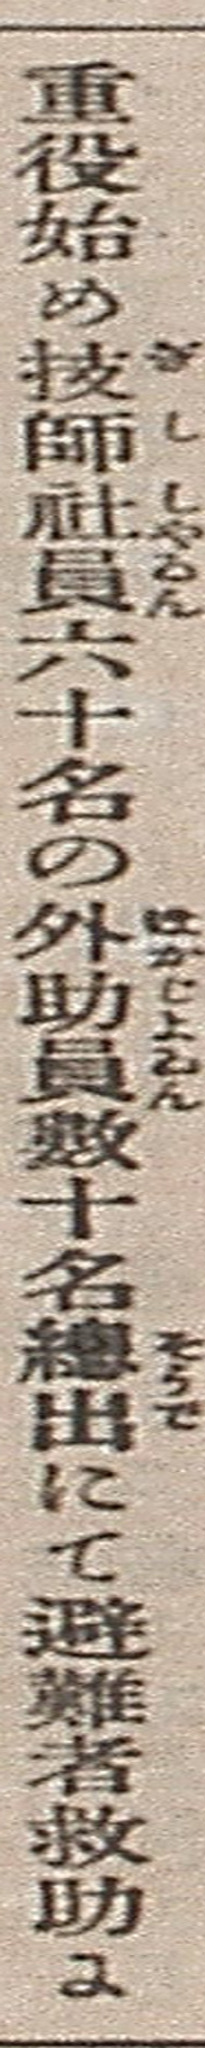重役始め技師社員六十名の外助員数十名総出にて避難者救助に
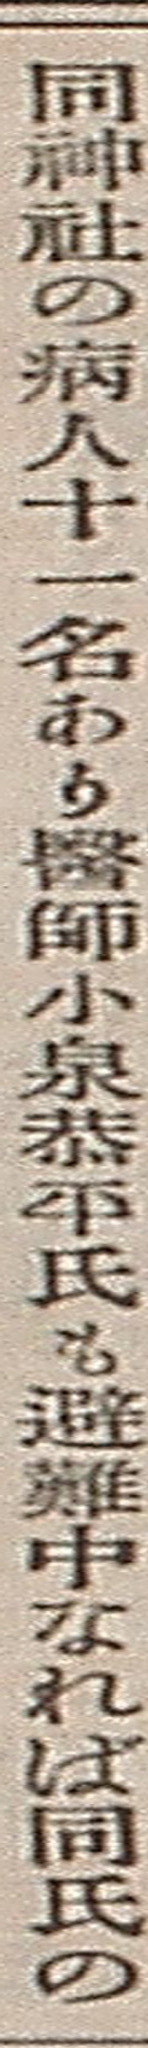同神社の病人十一名あり医師小泉恭平氏も避難中なれば同氏の
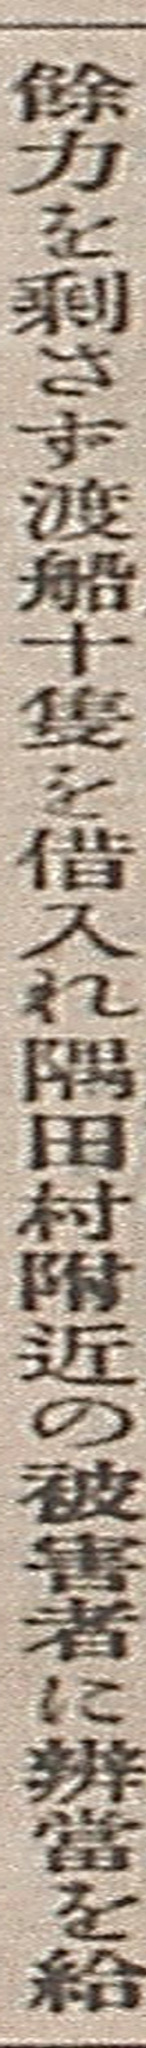余力を剰さず渡船十隻を借入れ隅田村付近の被害者に弁当を給
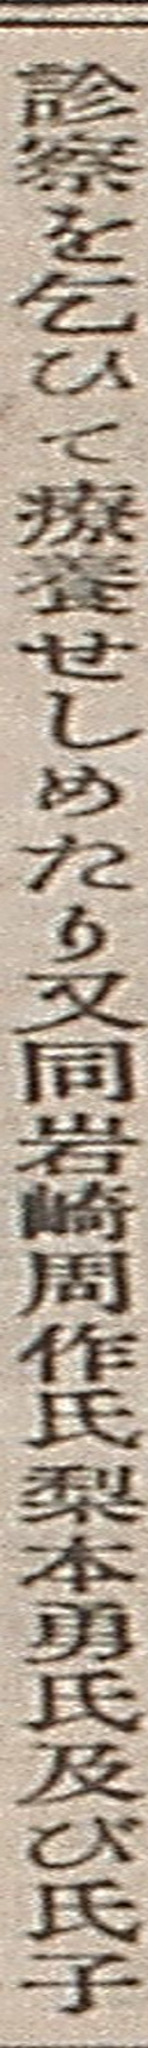診察を乞ひて療養せしめたり又同岩崎周作氏梨本勇氏及び氏子
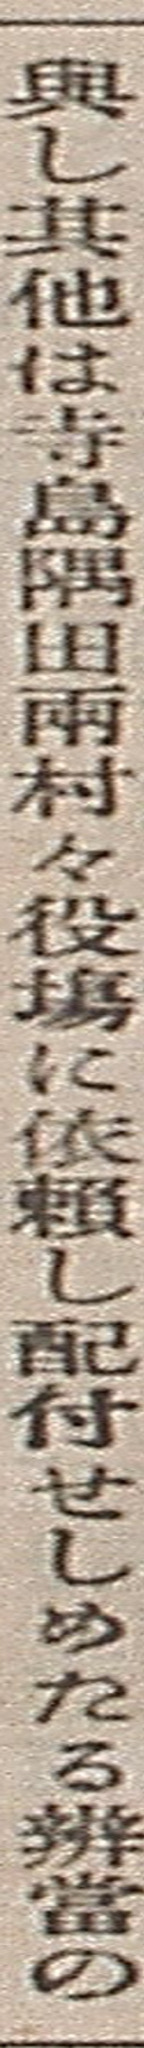与し其他は寺島隅田両村々役場に依頼し配布せしめたる弁当の
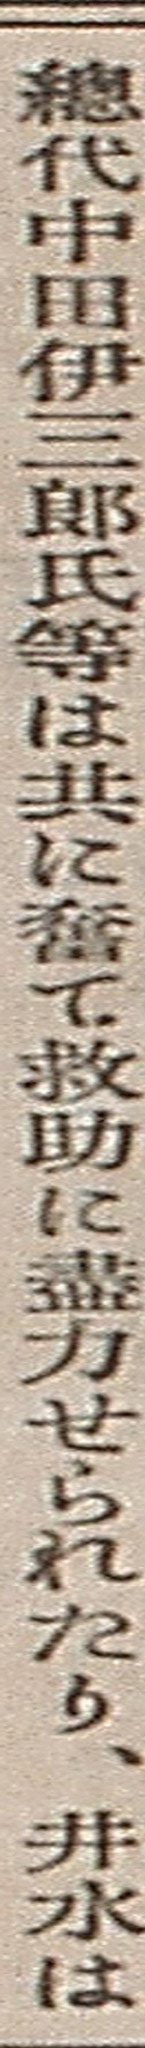総代中田伊三郎氏等は共に奮て救助に尽力せられたり、井水は
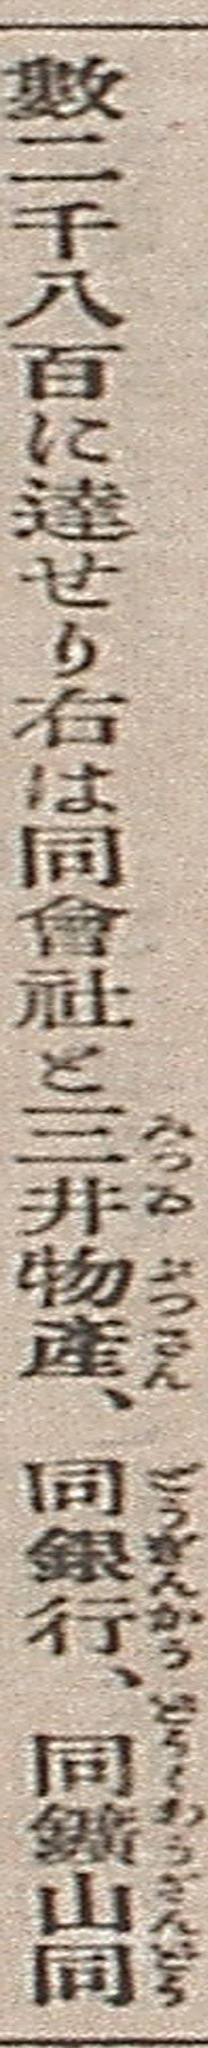数二千八百に達せり右は同会社と三井物産、同銀行、同鉱山同
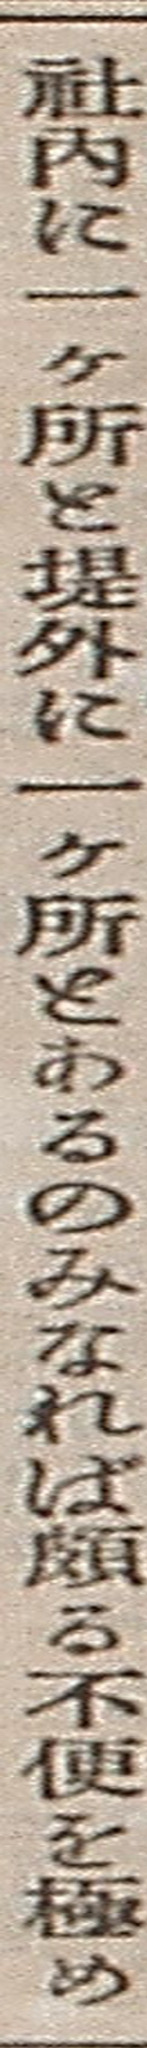社内に一ヶ所と堤外に一ヶ所とあるのみなれば頗る不便を極め
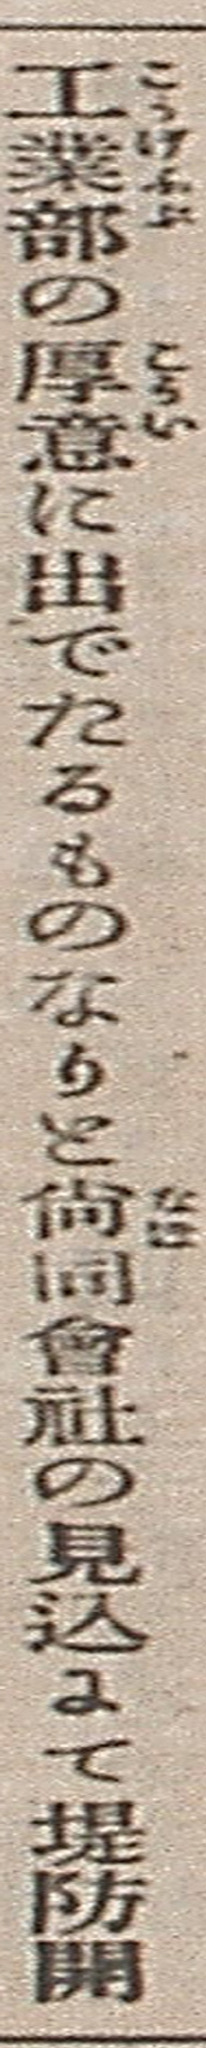工業部の厚意に出でたるものなりと尚同会社の見込にて堤防開
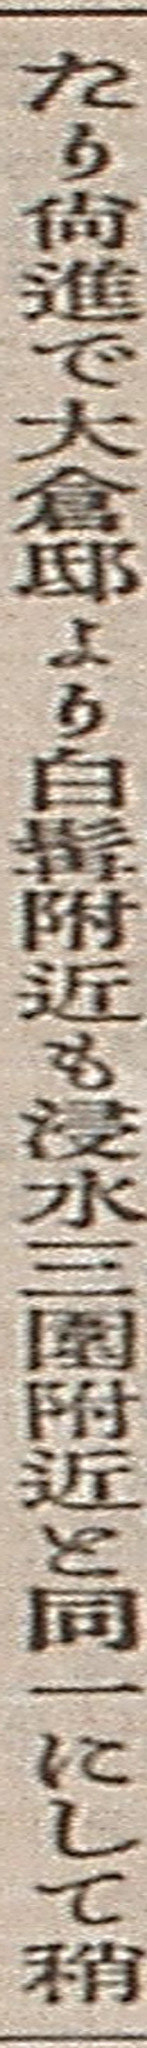たり尚進で大倉邸より白髭附近も浸水三囲附近と同一にして稍
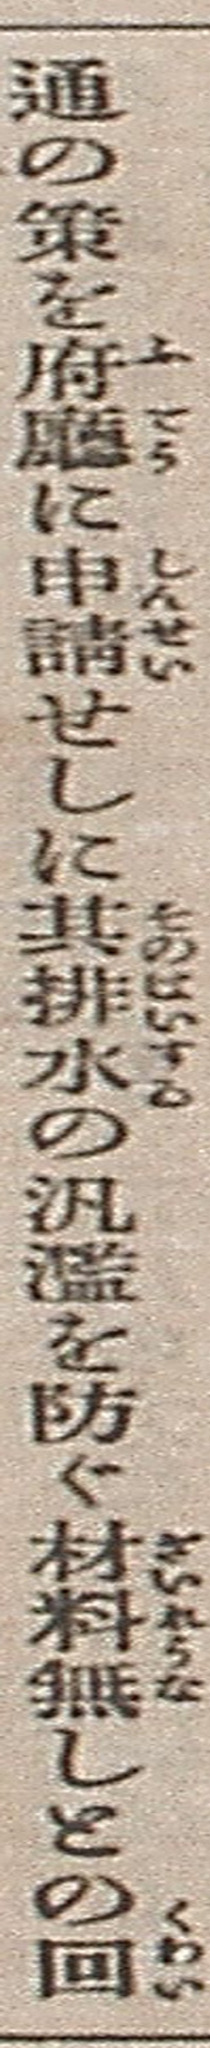通の策を府庁に申請せしに其排水の汎濫を防ぐ材料無しとの回
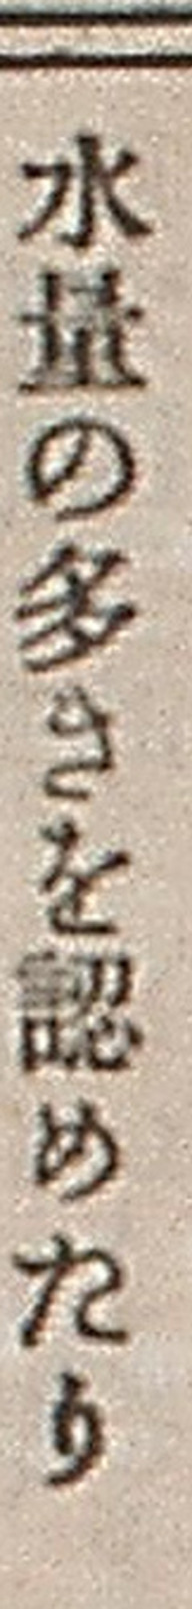水量の多きを認めたり
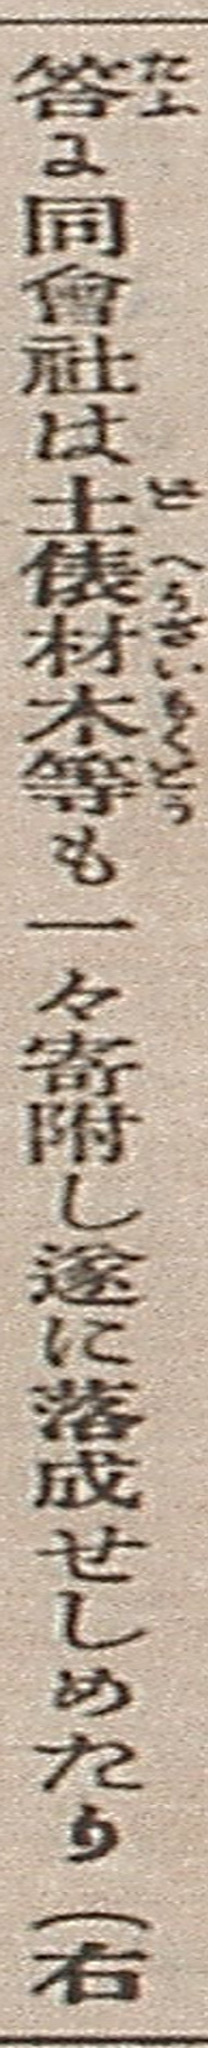答に同会社は土俵材木等も一々寄附し遂に落成せしめたり（右
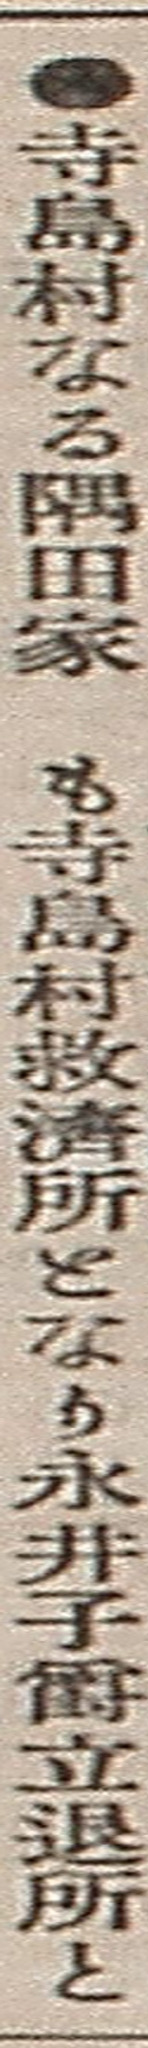●寺島村なる隅田家も寺島村救済所となり永井子爵立退所と
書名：風俗畫報臨時増刊第百二十四號　洪水地震被害録（上）
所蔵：東京大学地震研究所図書室 Earthquake Research Institute Library, The University of Tokyo, JAPAN
